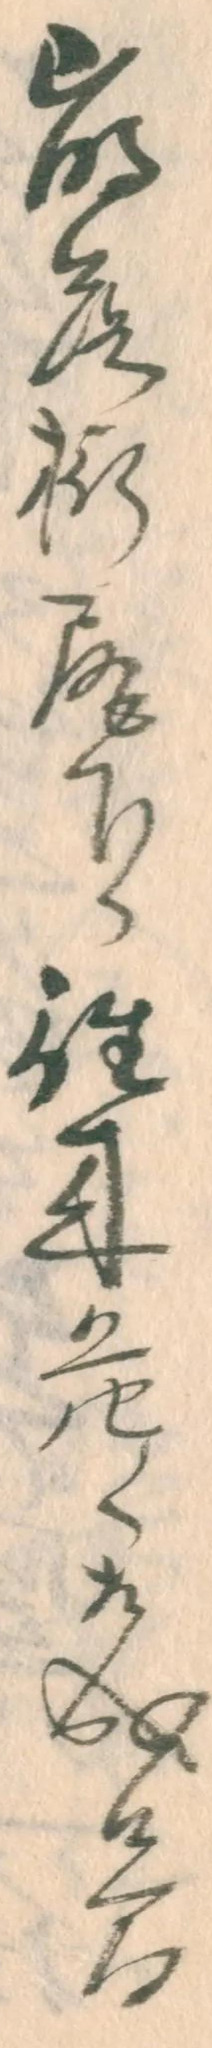崩落桁尻下り往来危く相成候間
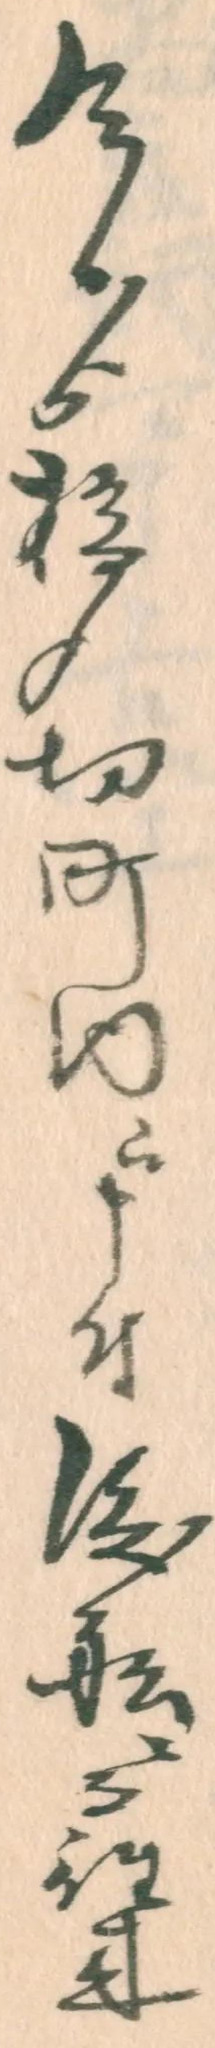今日ゟ橋〆切町内え申付渡船ニ而往来
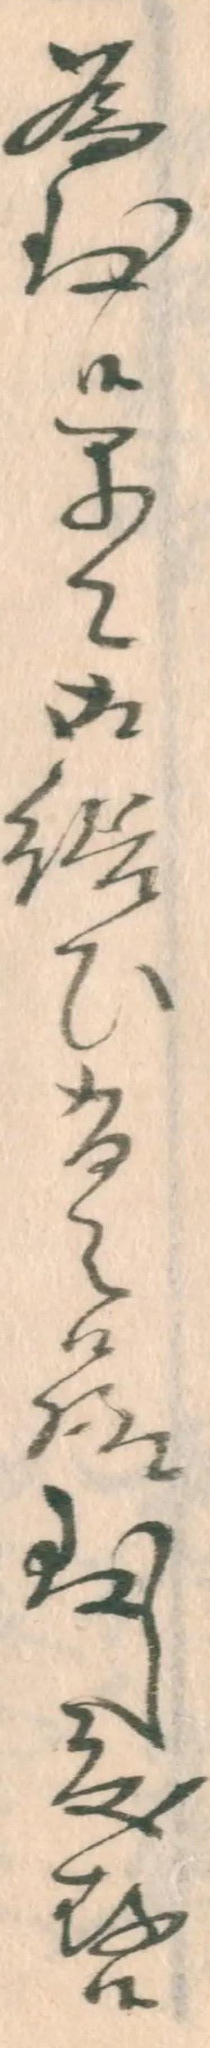為致候早々御繕ひ有之候様致し度存候
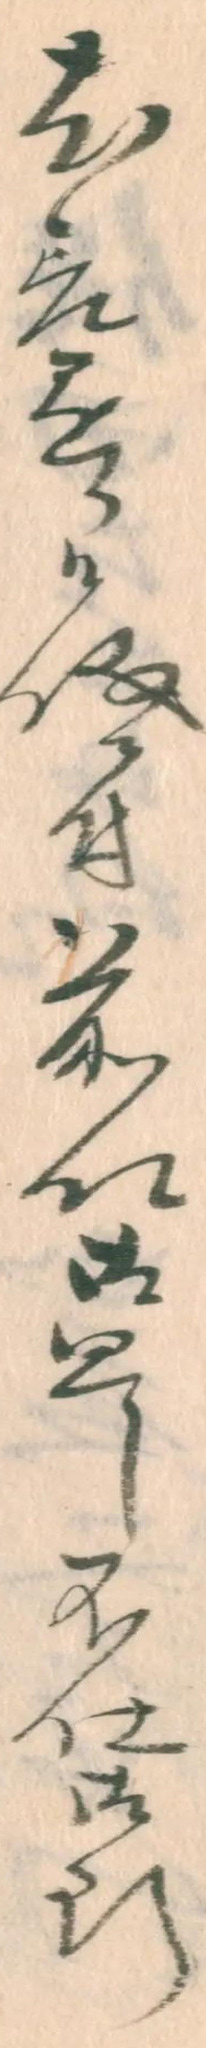尤差懸リ候儀ニ付前以御廻し不仕御断
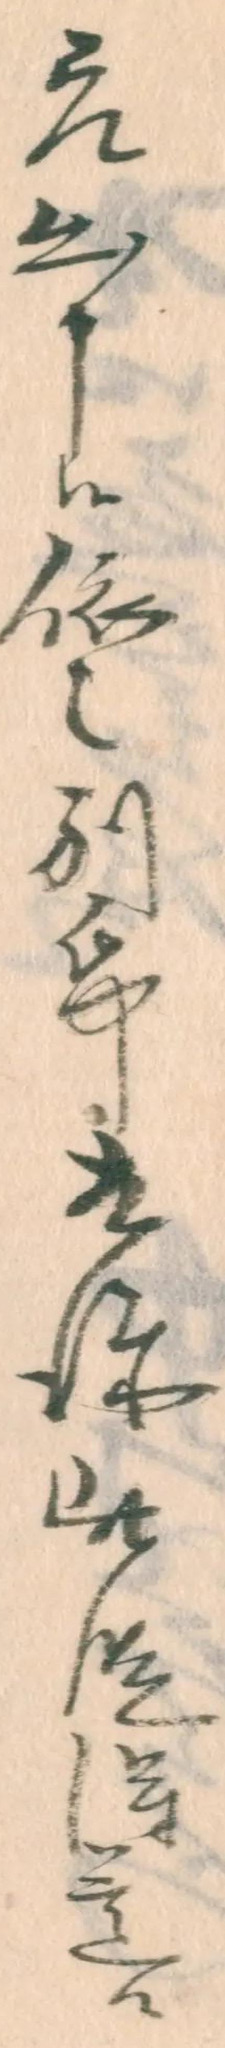差出申候依之別紙相添此段得御意候
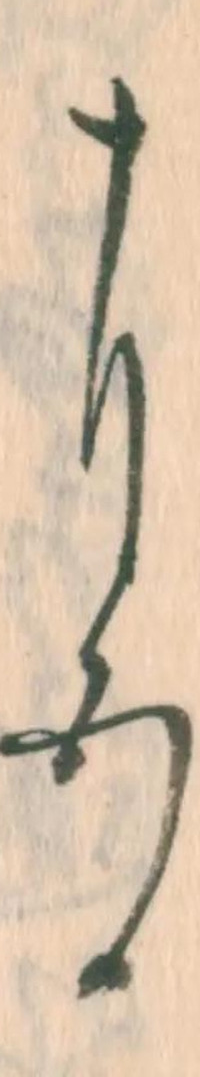十月五日
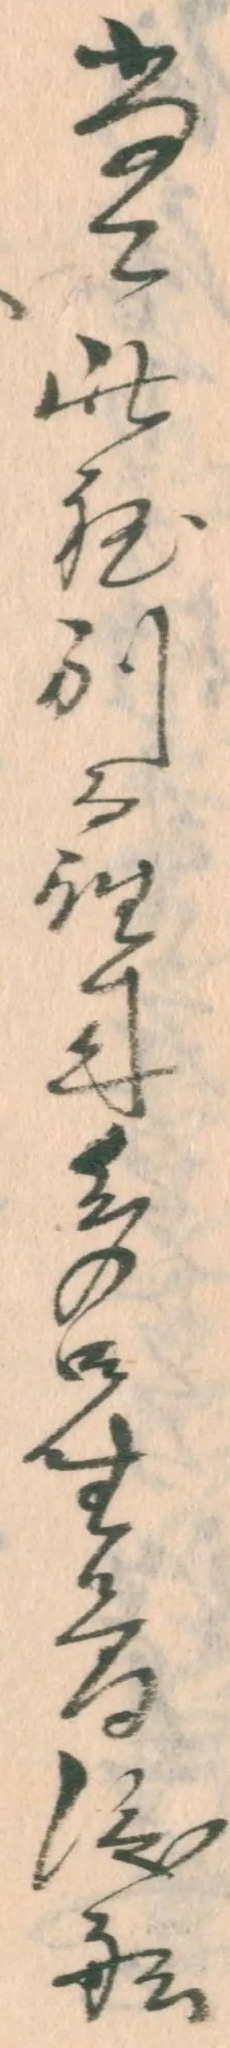尚々此程別而往来多御座候間渡船
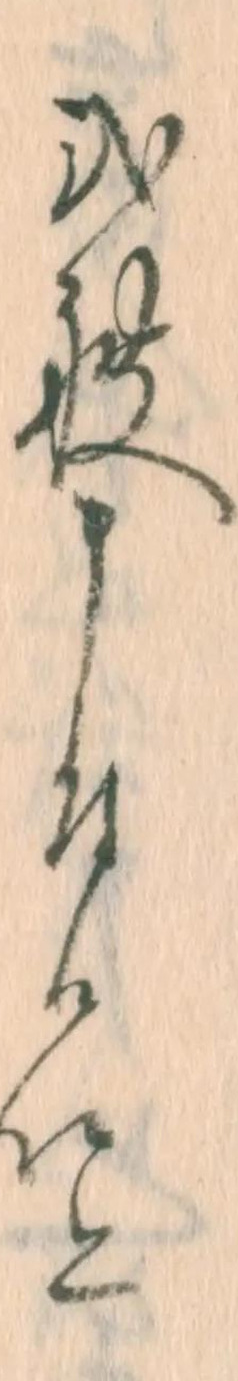弐艘申付候以上
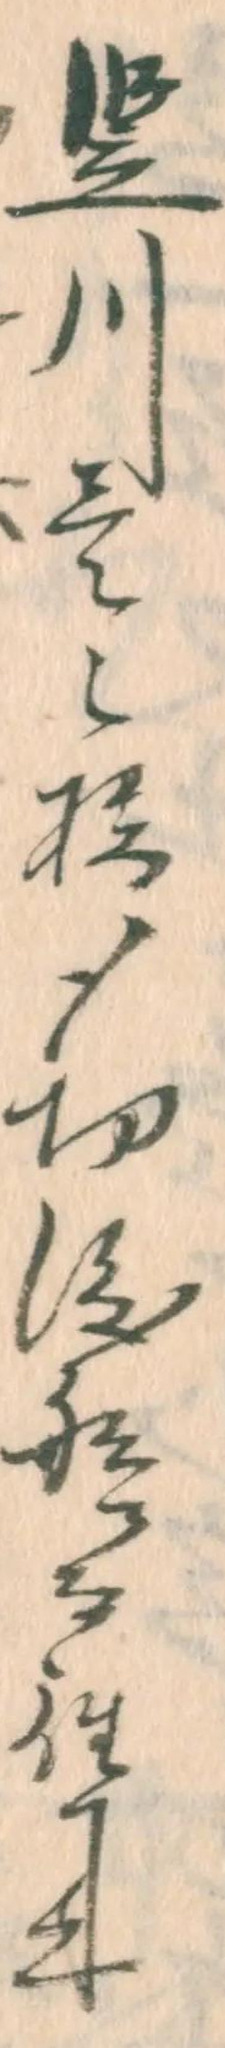│竪川壱之橋〆切渡船ニ而往来
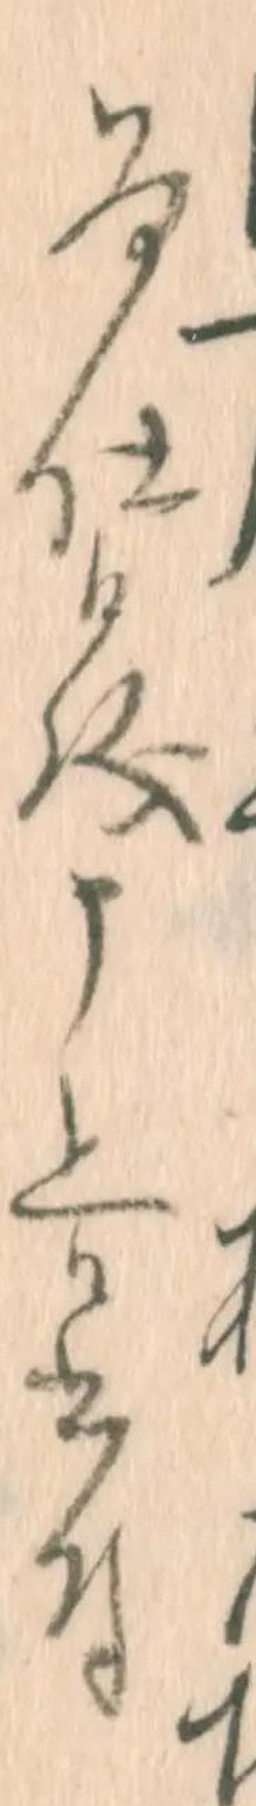│為仕候儀申上候書付
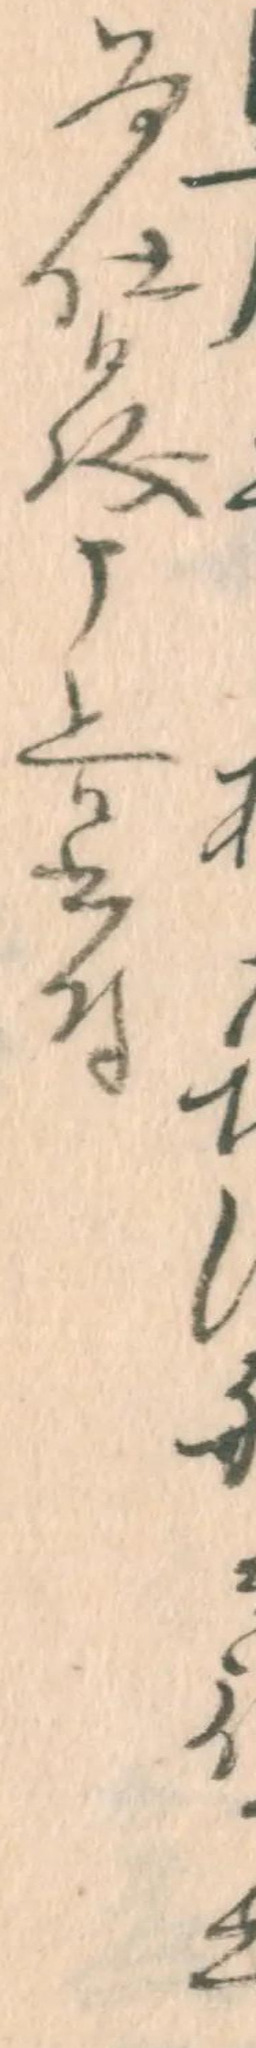│為仕候儀申上候書付
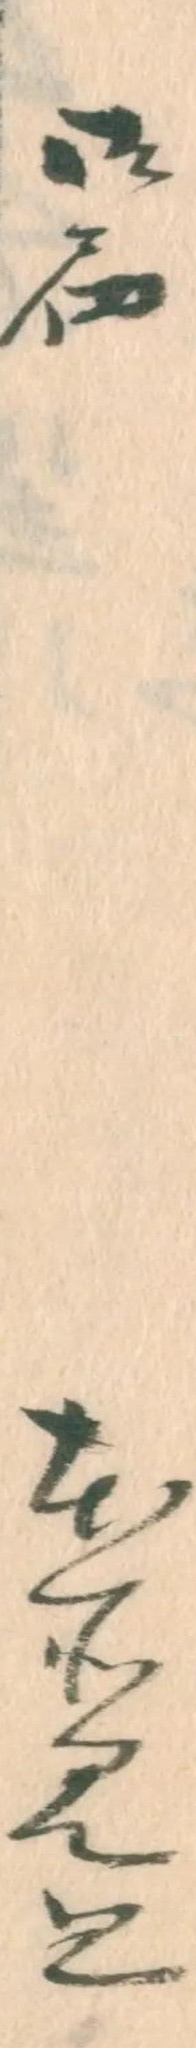│御届本所見廻

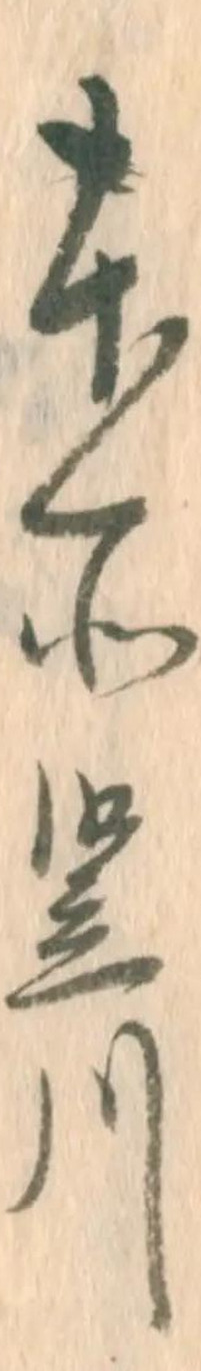本所竪川
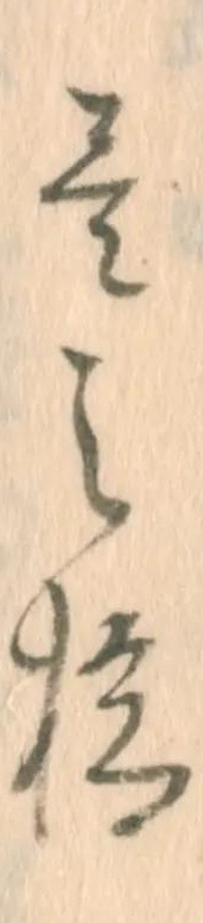壱之橋
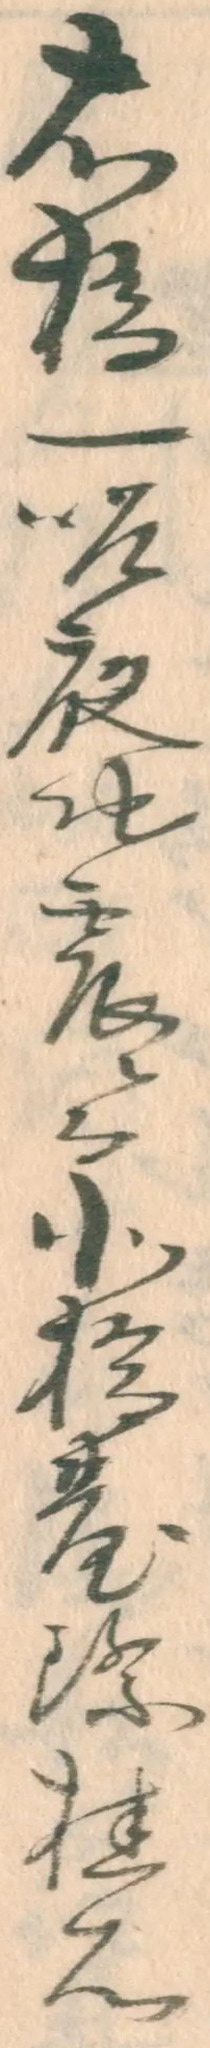右橋一昨日夜地震ニ而北橋台際柱石
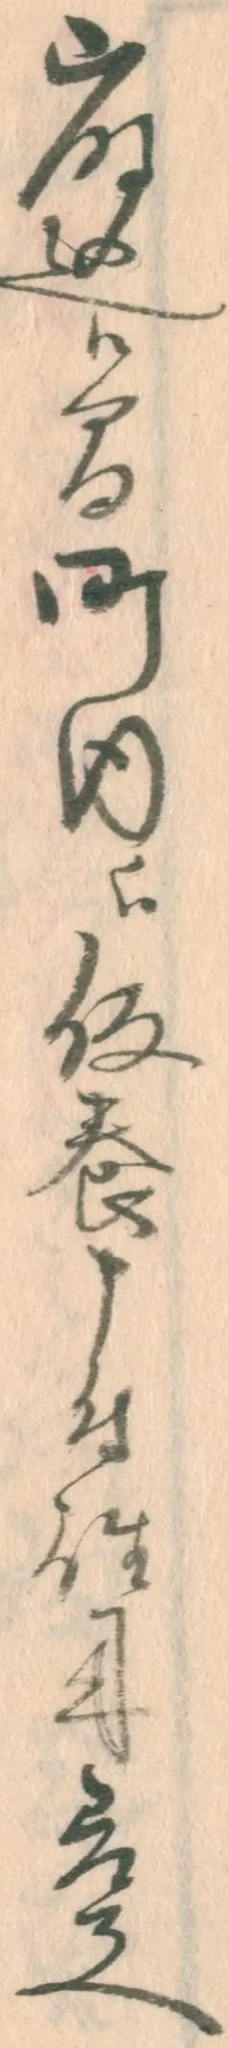崩込候間町内え仮養申付往来差支
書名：地震災書留 2巻. [1] 内表紙に「地震災書留　安政二卯年　但本所深川御用屋敷地代免除調」とあり
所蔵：国立国会図書館 National Diet Library, JAPAN
